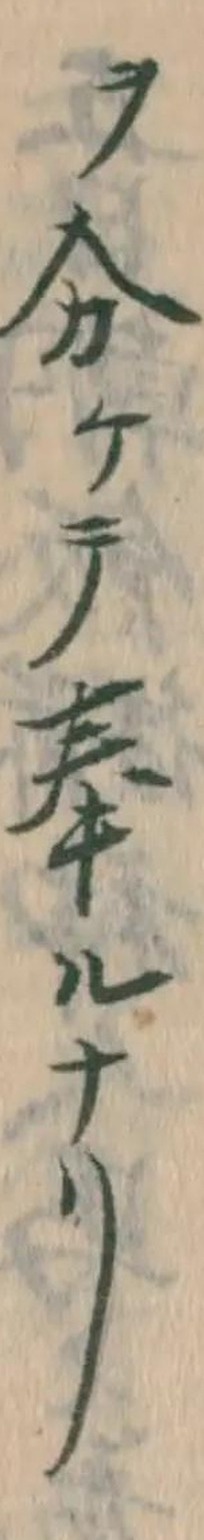ヲ分ケテ奉ルナリ
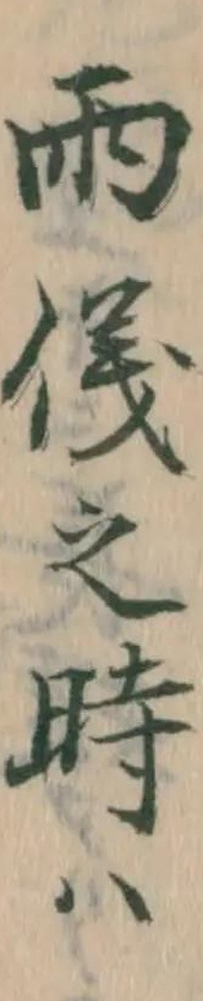雨儀之時ハ
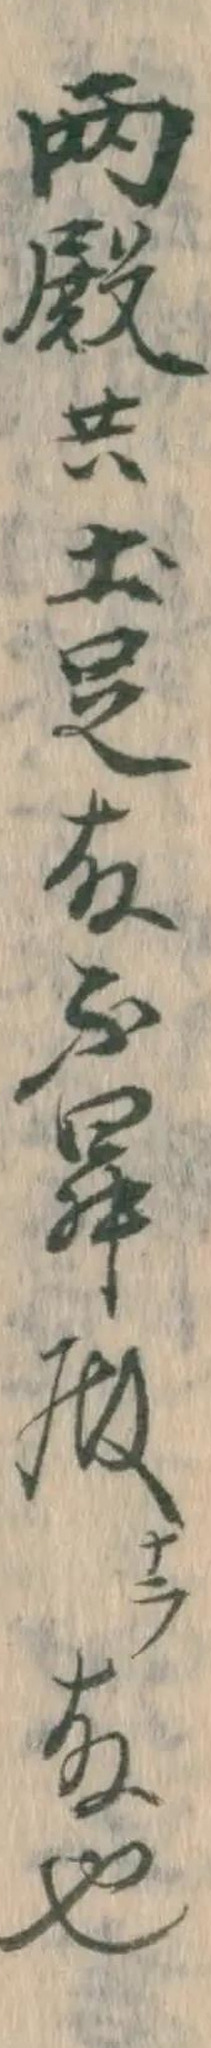両殿共土足故不昇殿ナラ故也
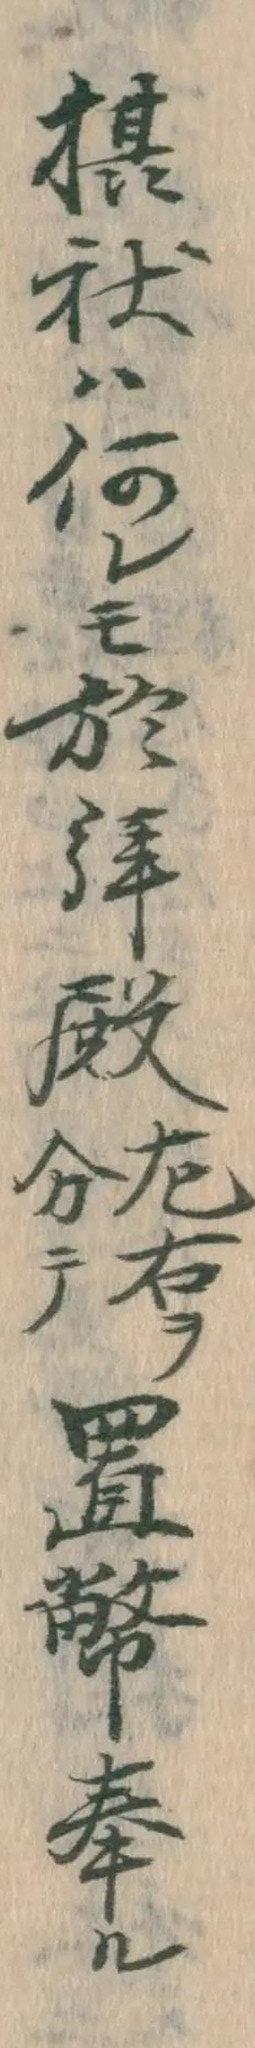摂社ハ何レモ於拝殿左右ヲ分テ置幣奉ル
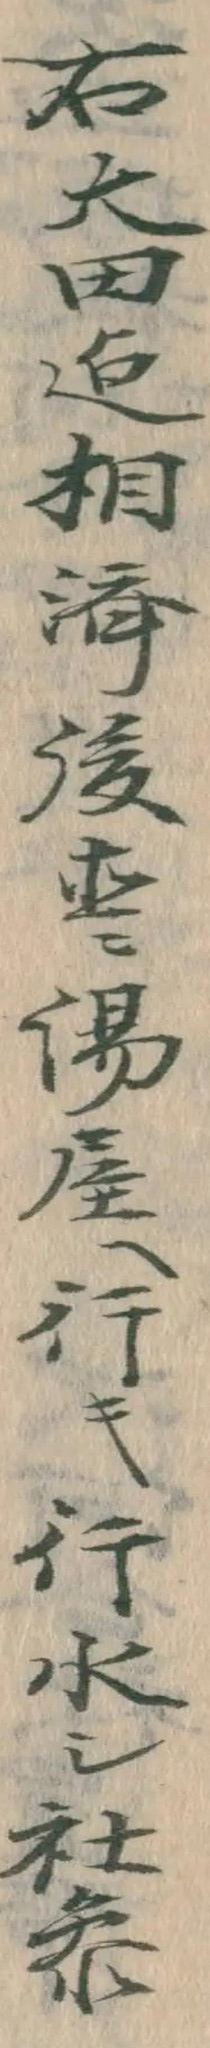右大田迄相済後直ニ湯屋へ行き行水シ社参
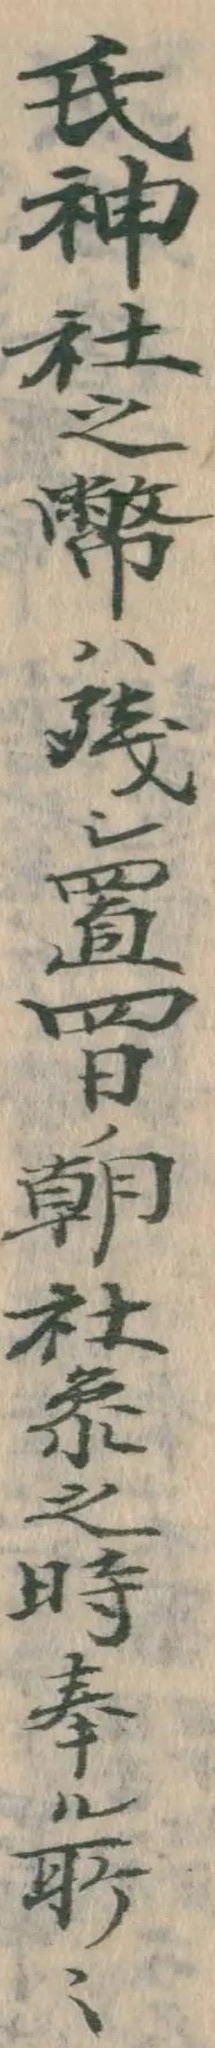氏神社之幣ハ残シ置四日ノ朝社参之時奉ル所々
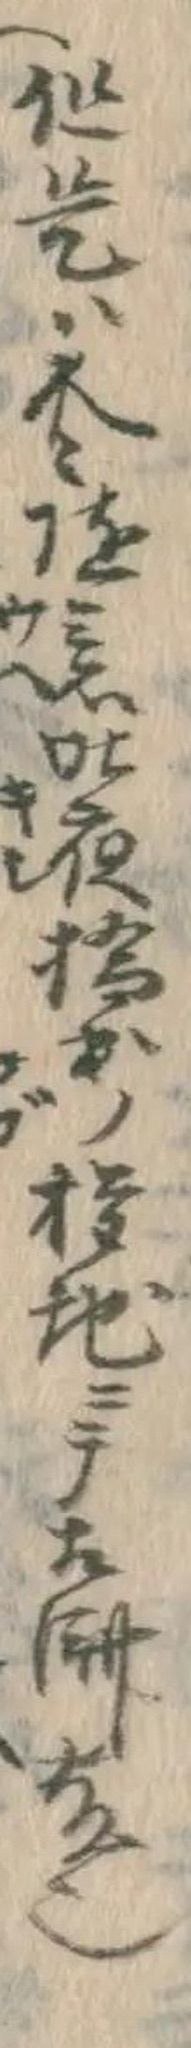\但是ハ人々随意昨夜橋本ノ権地ニテ相済故也
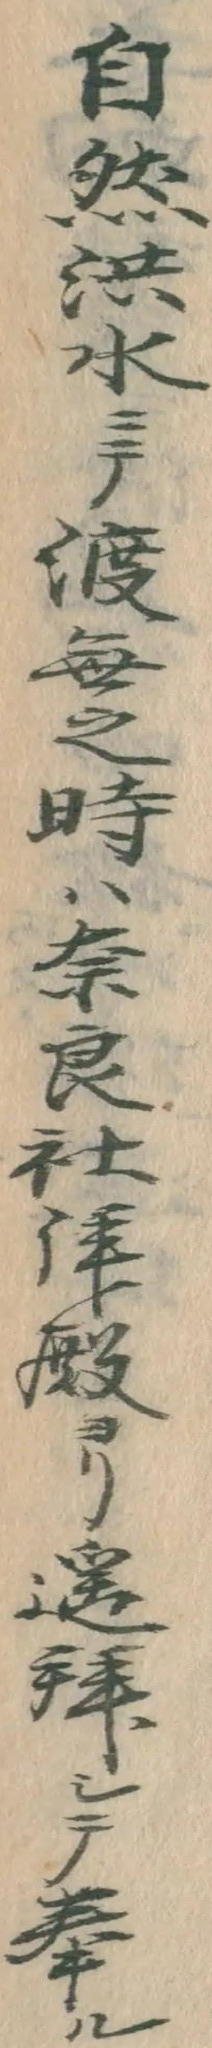自然洪水ニテ渡無之時ハ奈良社拝殿ヨリ遥拝シテ奉ル

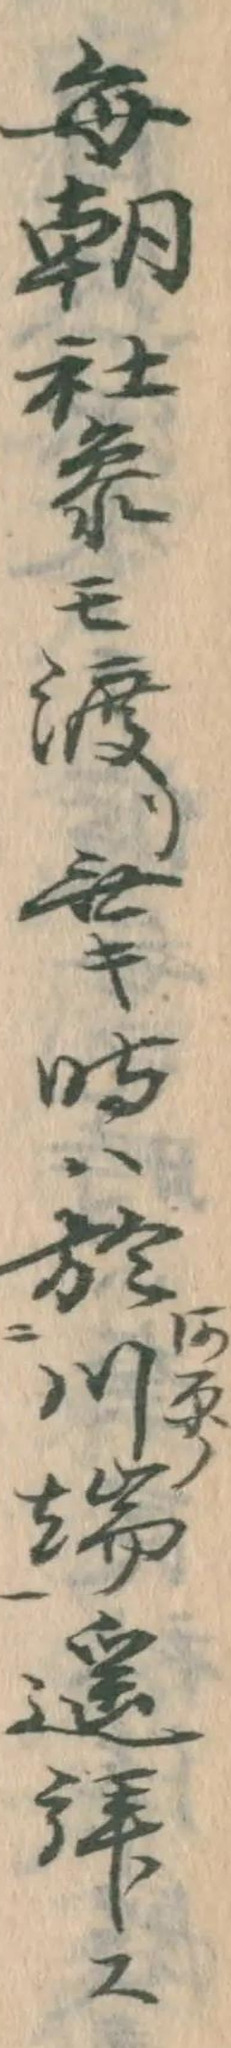毎朝社参モ渡リ無キ時ハ於川端遥拝ス
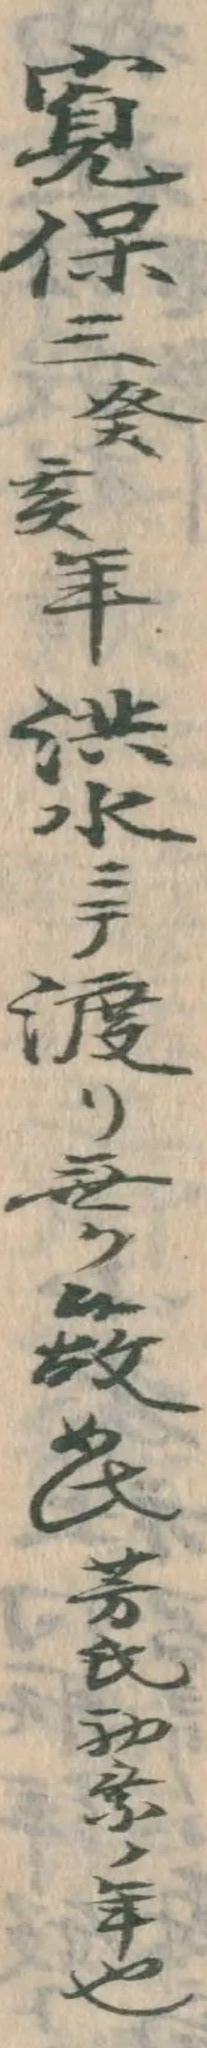寛保三癸亥年洪水ニテ渡リ無ク候故如此芳氏初乗ノ年也
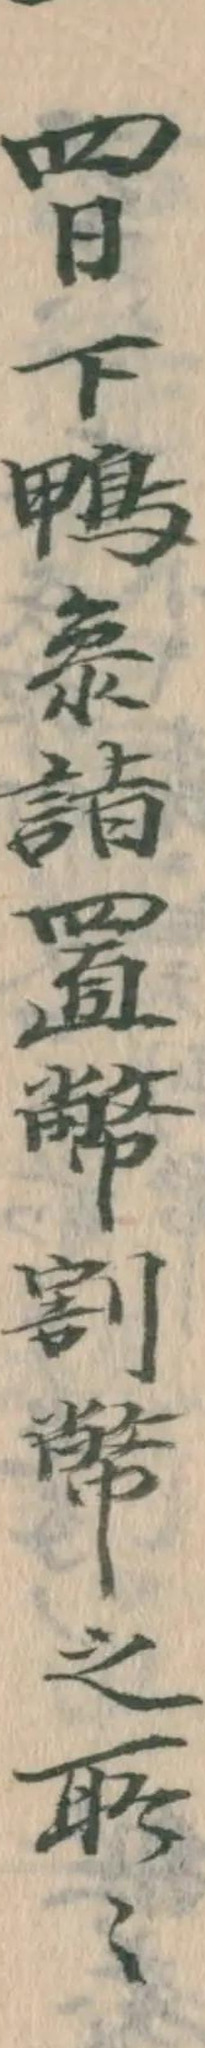一四日下鴨参詣置幣割幣之所々
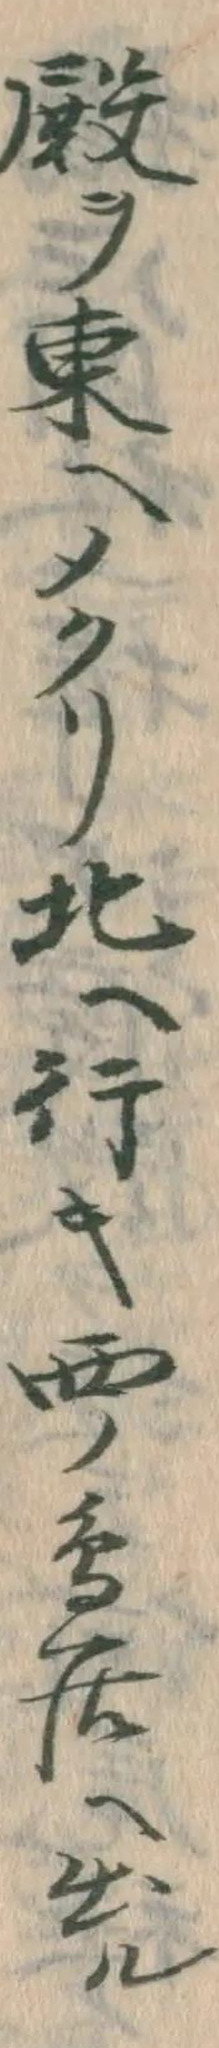殿ヲ東ヘメクリ北へ行キ西ノ鳥居へ出ル
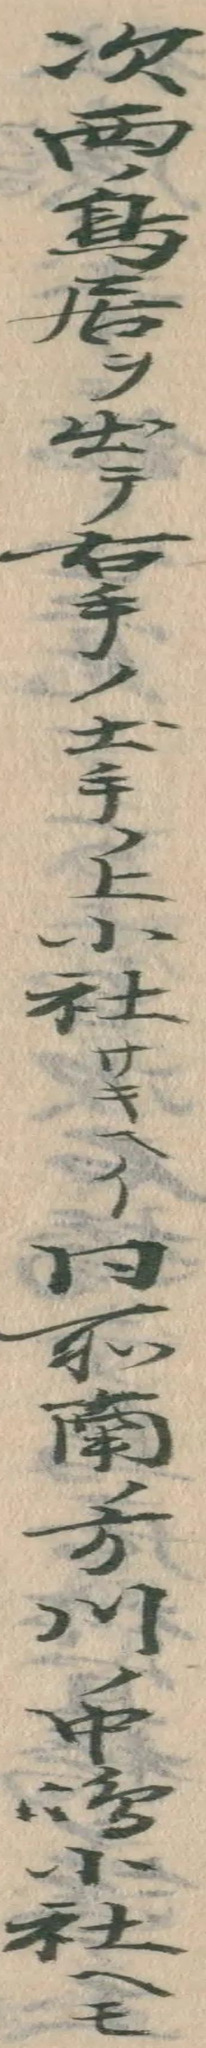次西ノ鳥居ヲ出テ右手ノ土手ノ上小社サキヘイ同所南ノ方川ノ中島小社ヘモ
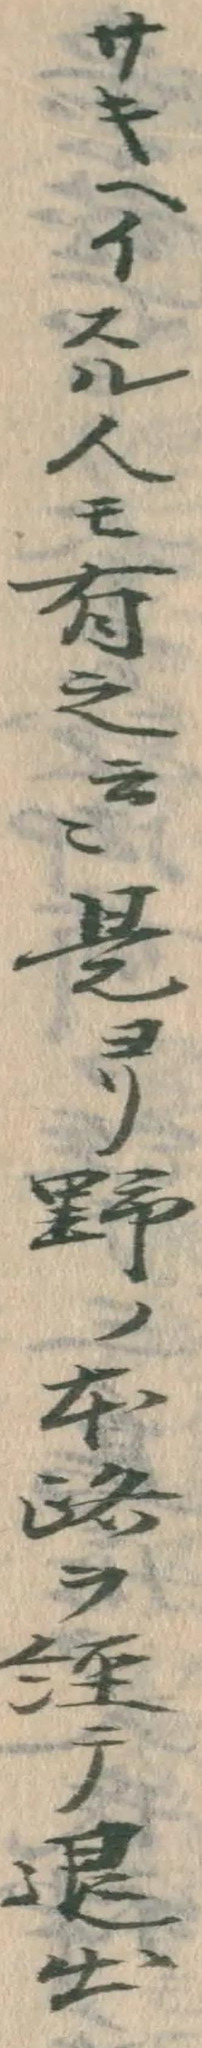サキヘイスル人モ有之云々是ヨリ野ノ本路ヲ経テ退出
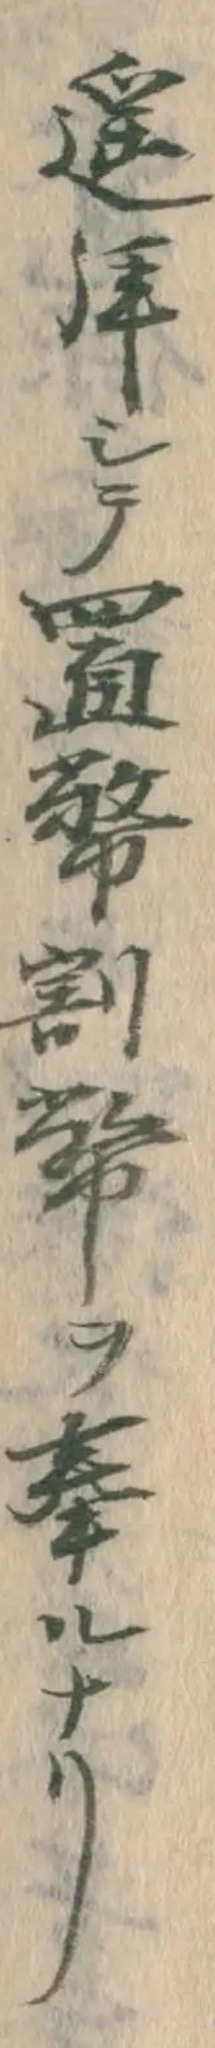遥拝シテ置幣割幣ヲ奉ルナリ

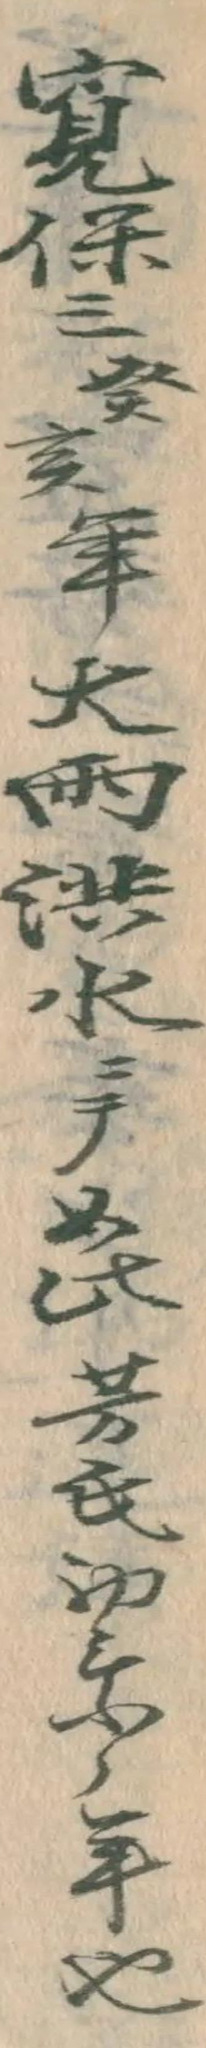寛保三癸亥年大雨洪水ニテ如此芳氏初乗ノ年也
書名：賀茂社記録. 第11冊
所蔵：国立国会図書館 National Diet Library, JAPAN
